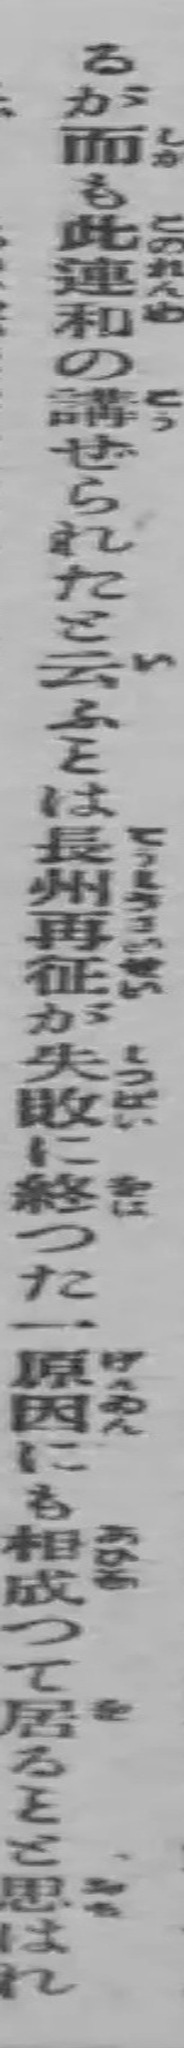るが而も此連和の講ぜられたと云ふことは長州再征が失敗に終つた一原因にも相成つて居ることと思はれ
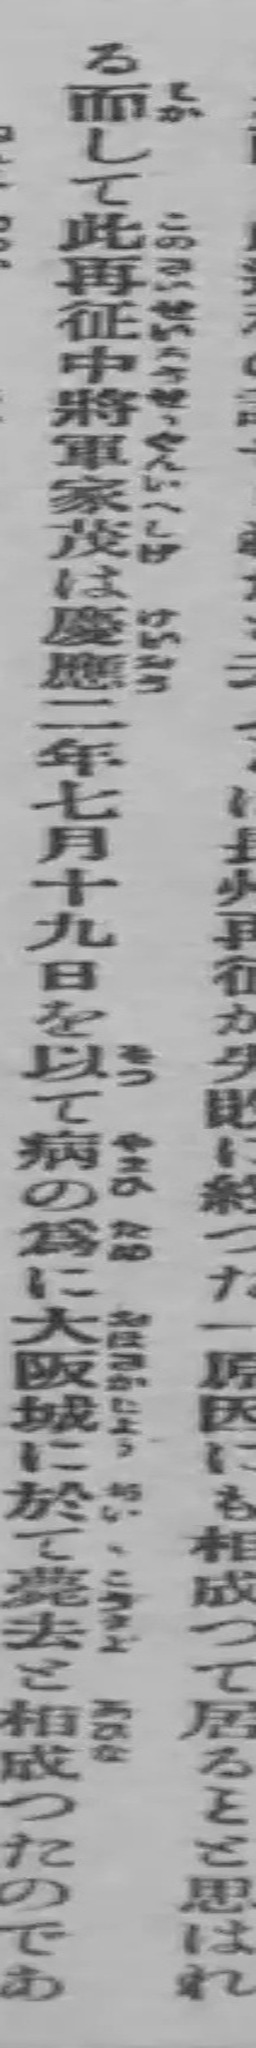る而して此再征中将軍家茂は慶応二年七月十九日を以て病の為に大阪城に於て薨去と相成つたのであ
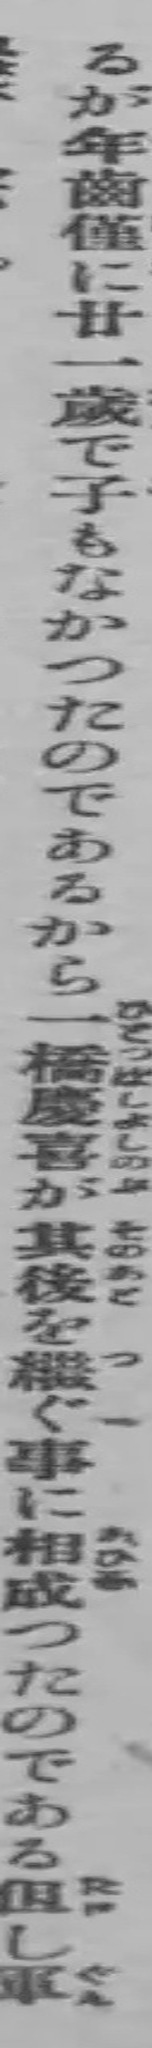るが年歯僅に廿一歳で子もなかつたのであるから一橋慶喜が其後を継ぐ事に相成つたのである但し軍
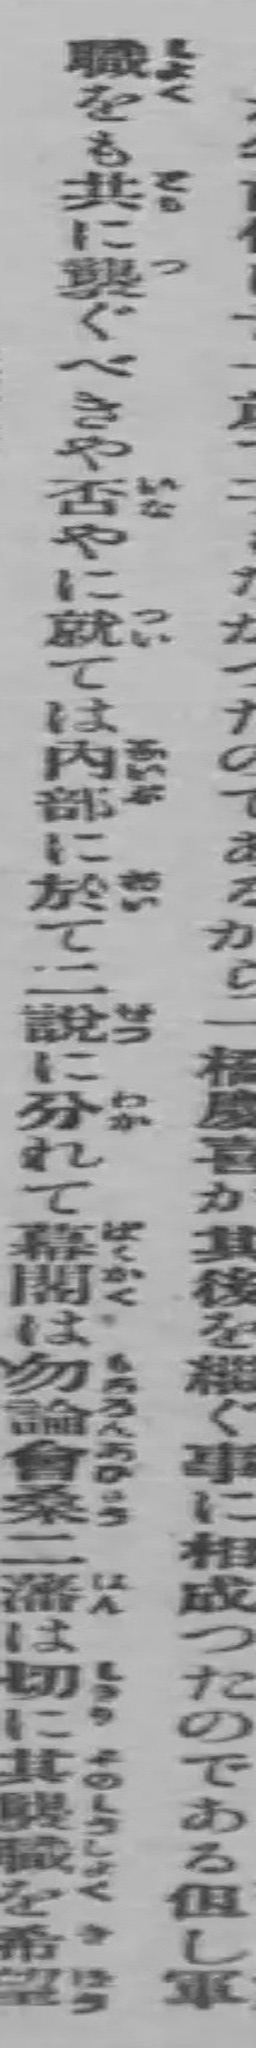職をも共に襲ぐべきや否やに就ては内部に於て二説に分れて幕閣は勿論会桑二藩は切に其襲職を希望
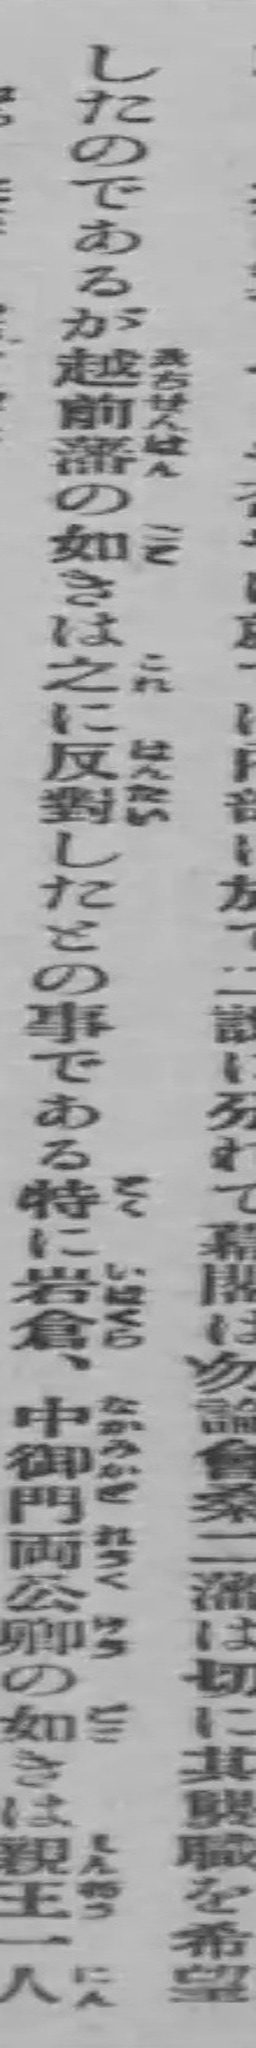したのであるが越前藩の如きは之に反対したとの事である特に岩倉、中御門両公卿の如きは親王一人
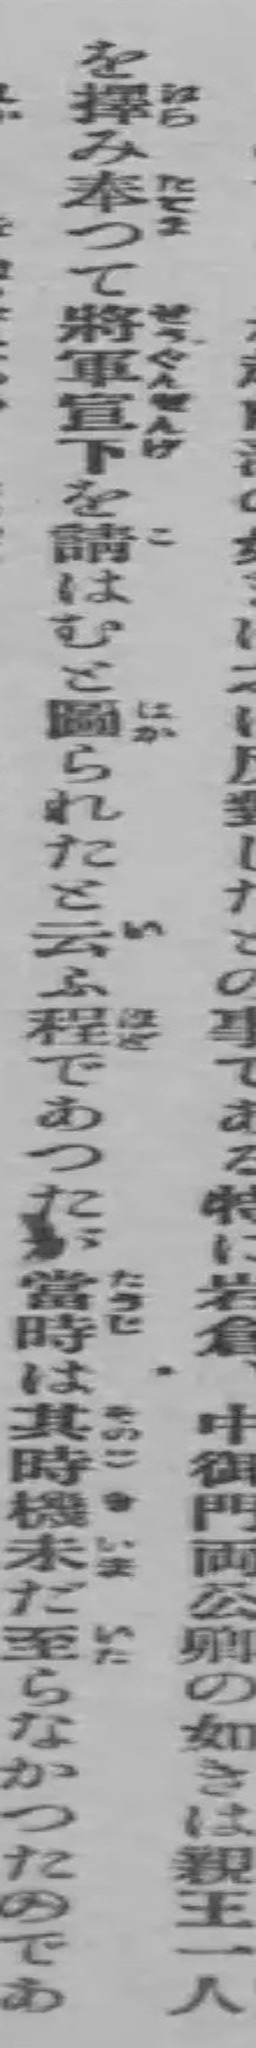を擇み奉つて将軍宣下を請はむと画られたと云ふ程であつたが当時は其時機未だ至らなかつたのであ
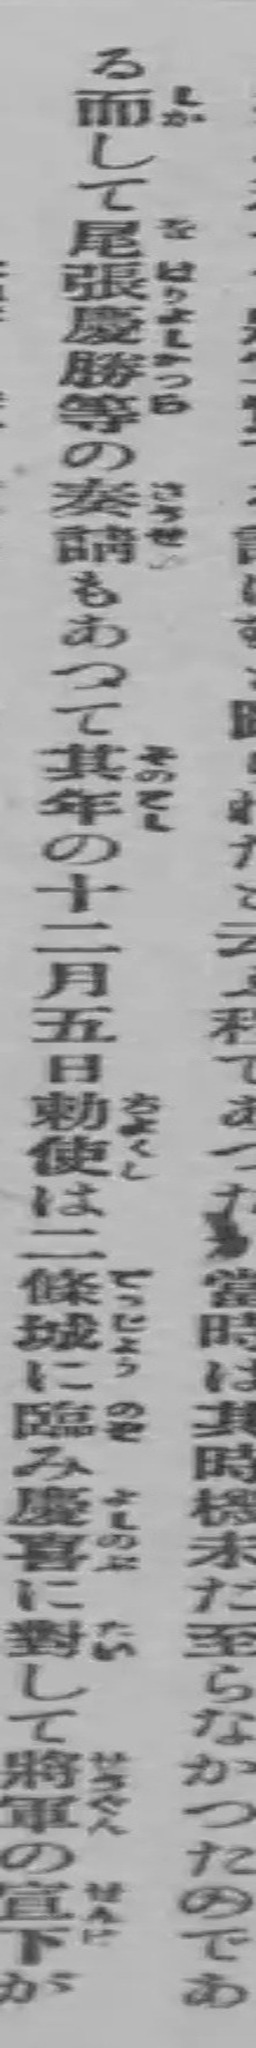る而して尾張慶勝等の奏請もあつて其年の十二月五日勅使は二条城に臨み慶喜に対して将軍の宣下が
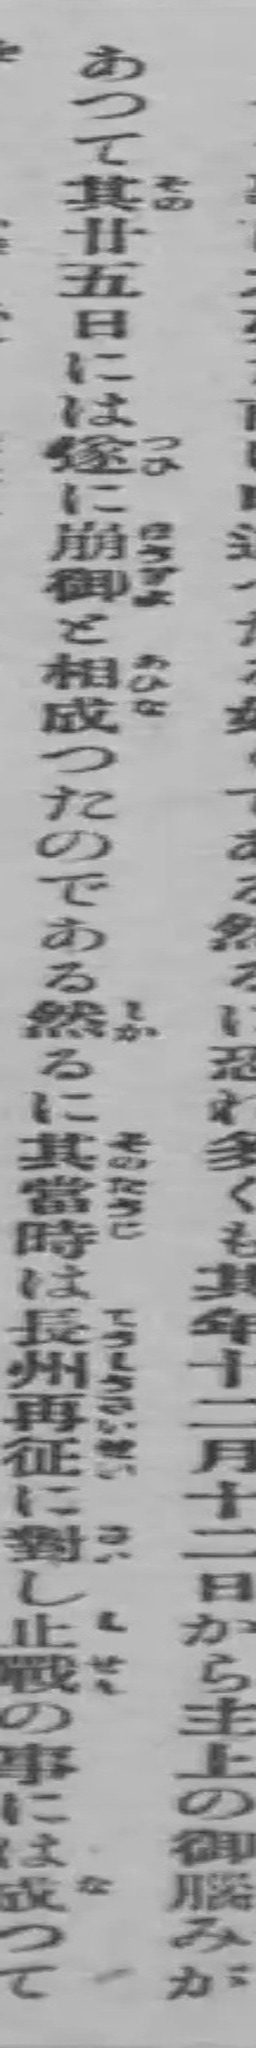あつて其廿五日には遂に崩御と相成つたのである然るに其当時は長州再征に対し止戦の事には成つて
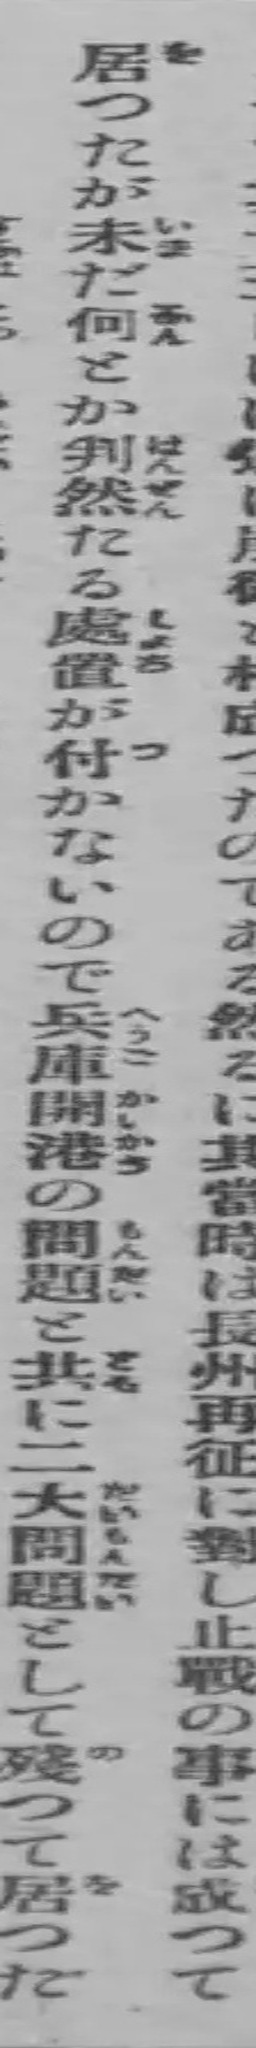居つたが未だ何とか判然たる処置が付かないので兵庫開港の問題と共に二大問題として残つて居つた
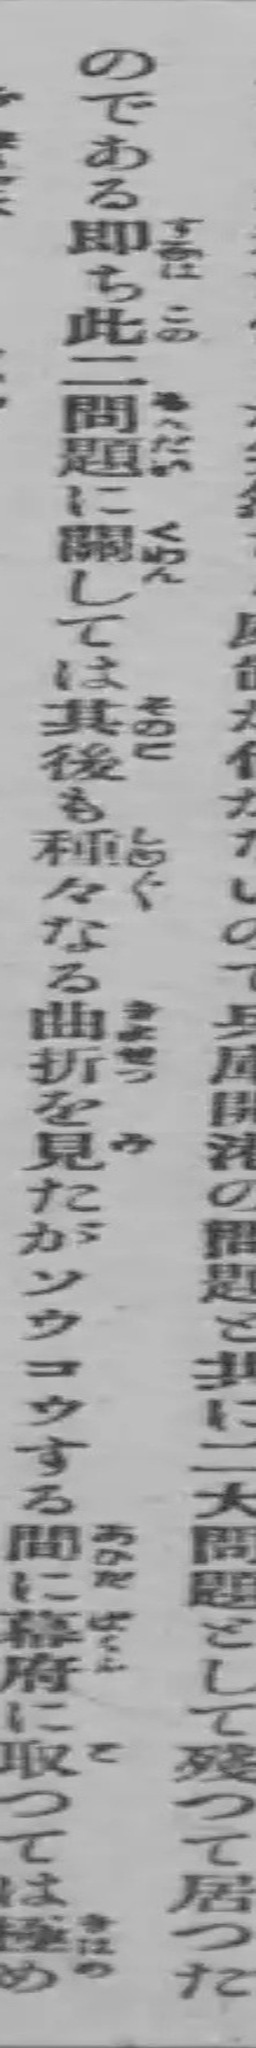のである即ち此二問題に関しては其後も種々なる曲折を見たがソウコウするる間に幕府に取つては極め
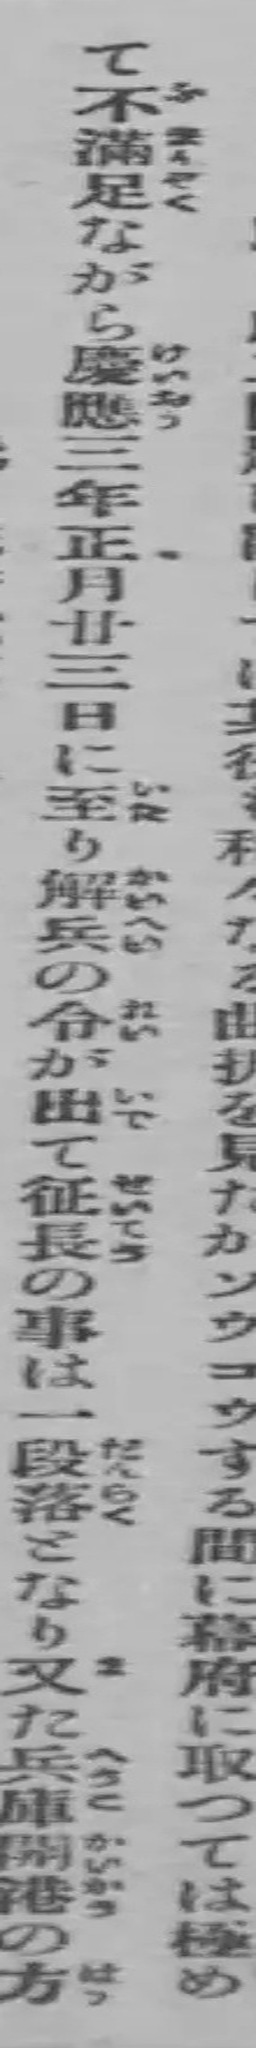て不満足ながら慶応三年正月廿三日に至り解兵の令が出て征長の事は一段落となり又た兵庫開港の方
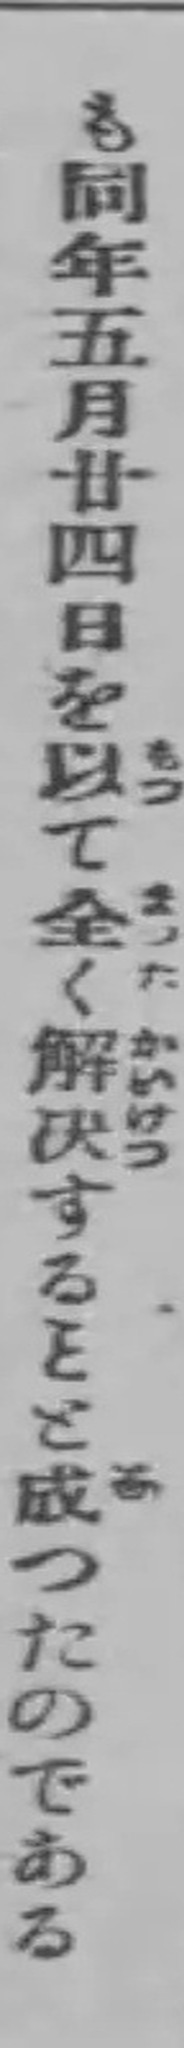も同年五月廿四日を以て全く解決することと成つたのである
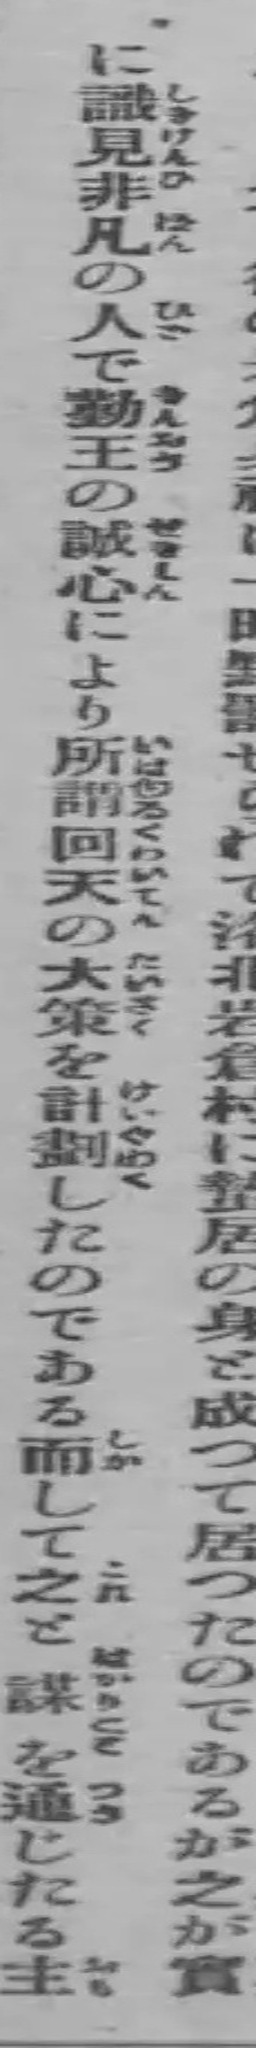に識見非凡の人で勤王の誠心により所謂回天の大策を計画したのである而して之と謀を通じたる主

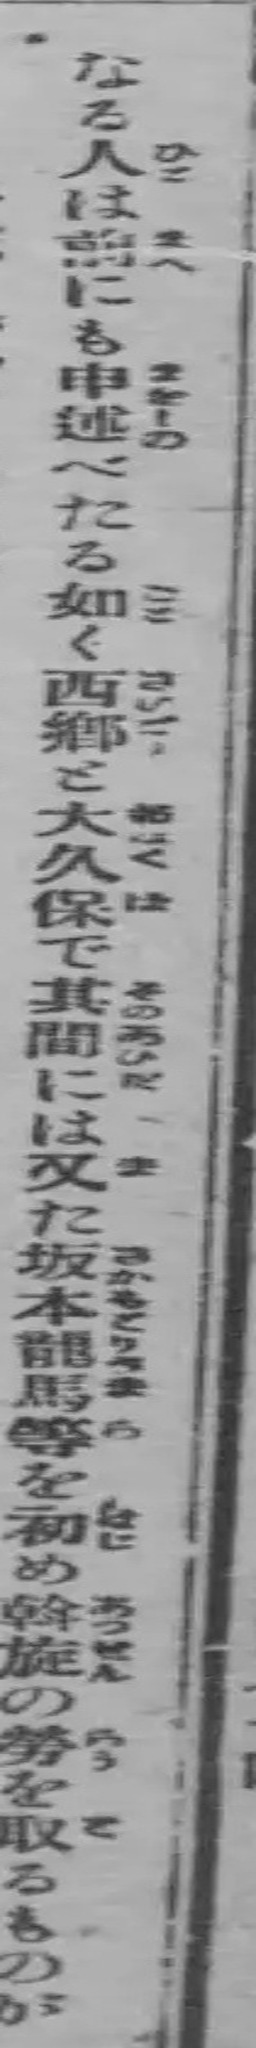なる人は前にも申述べたる如く西郷と大久保で其間には又た坂本龍馬等を初め斡旋の労を取るものが
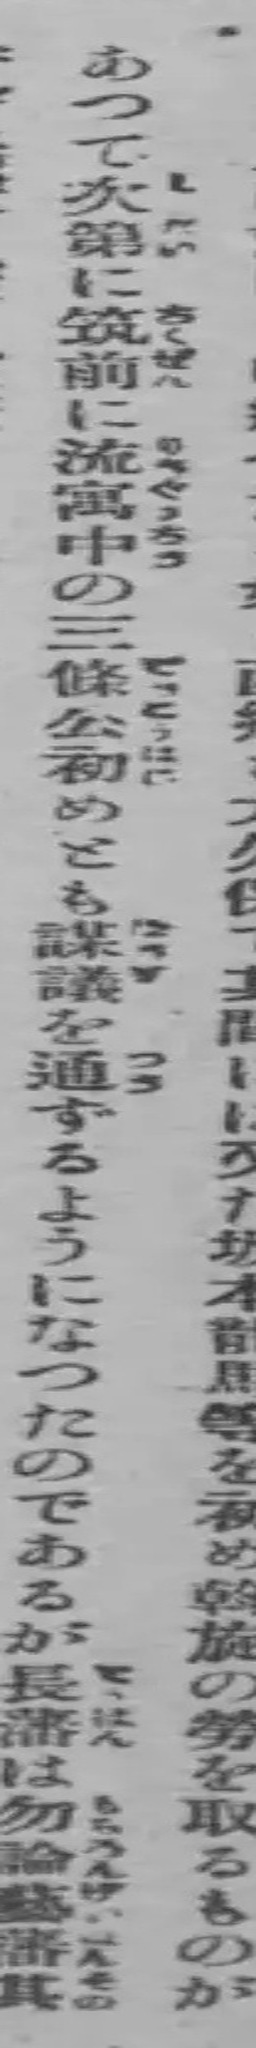あつて次第に筑前に流寓中の三條公初めとも謀議を通ずるようになつたのであるが長藩は勿論芸藩其
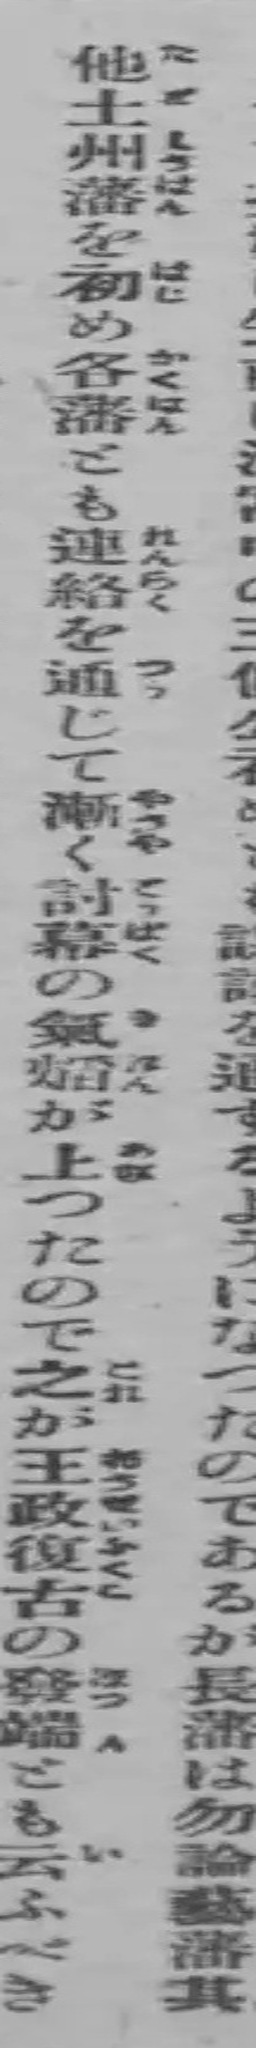他土州藩を初め各藩とも連絡を通じて漸く討幕の気焔が上つたので之が王政復古の発端とも云ふべき
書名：豊橋市史談
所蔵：国立国会図書館 National Diet Library, JAPAN
